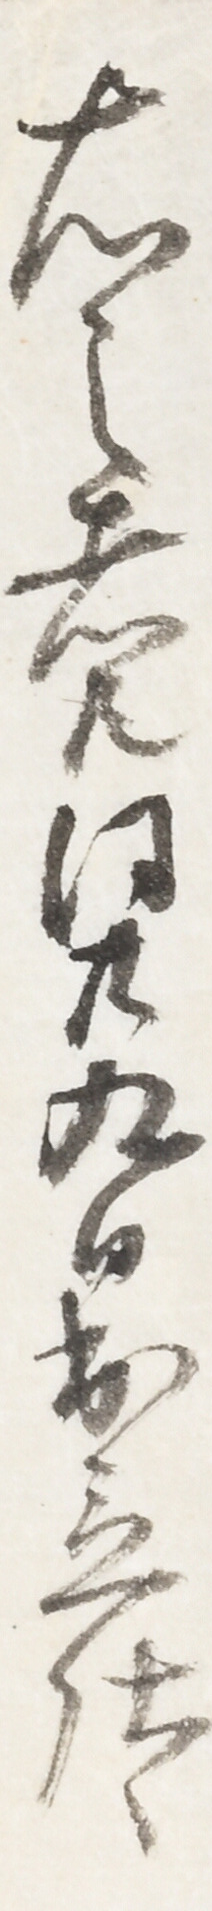右之者共同廿九日出立仕候
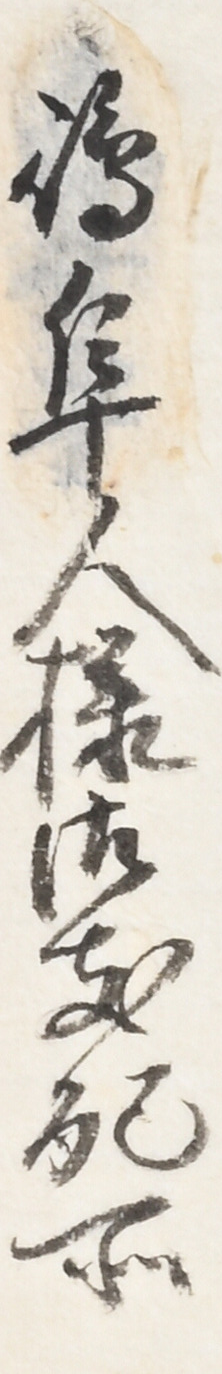嶋隼人様御支配所
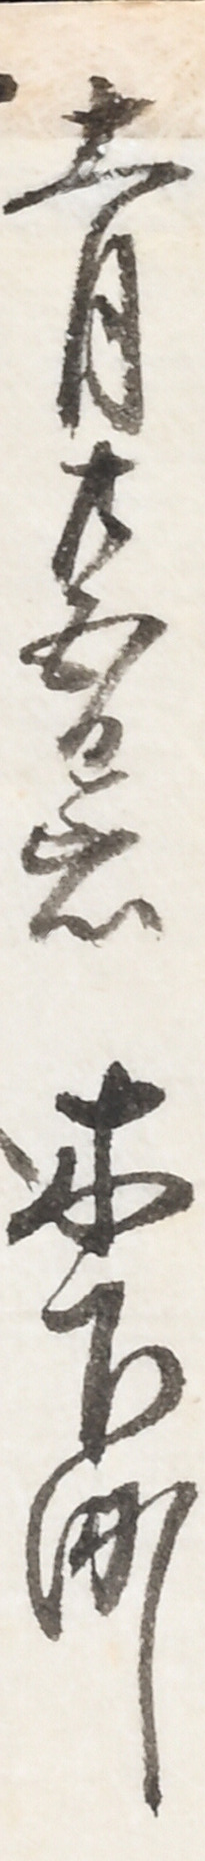十一月廿五日着木下町
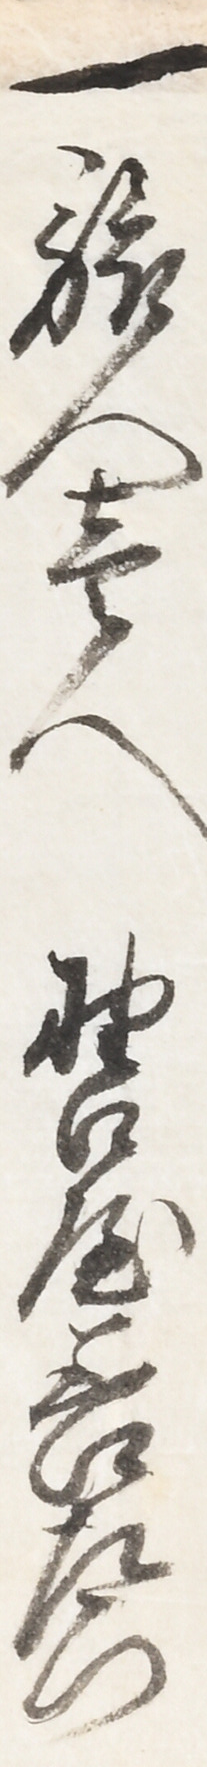一旅人壱人野口屋善左衛門
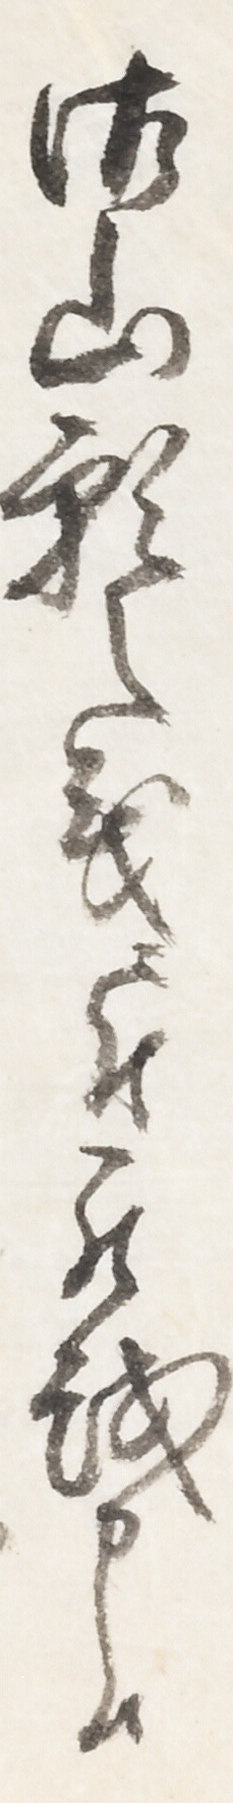御山願之義ニ付罷越申候
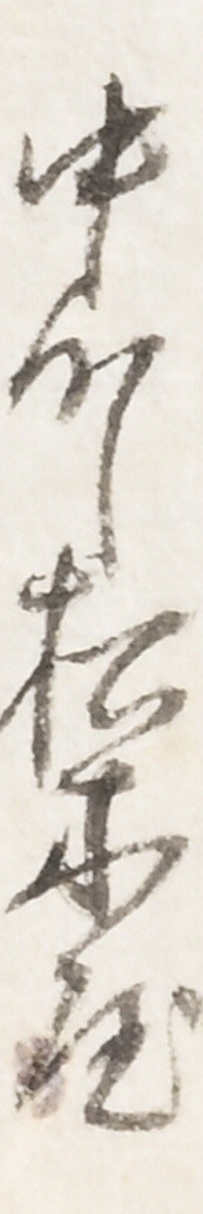中町松木屋
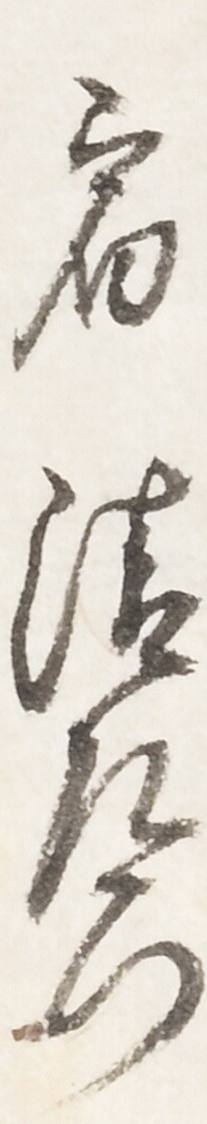宿清左衛門
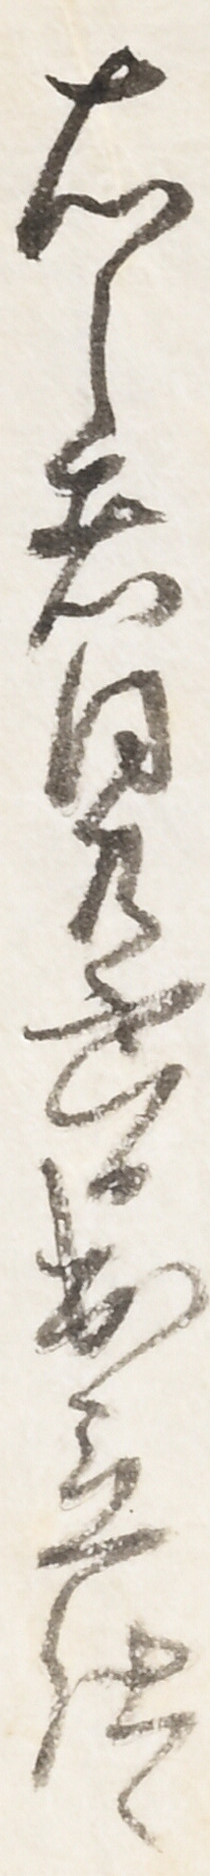右之者同廿六日出立仕候
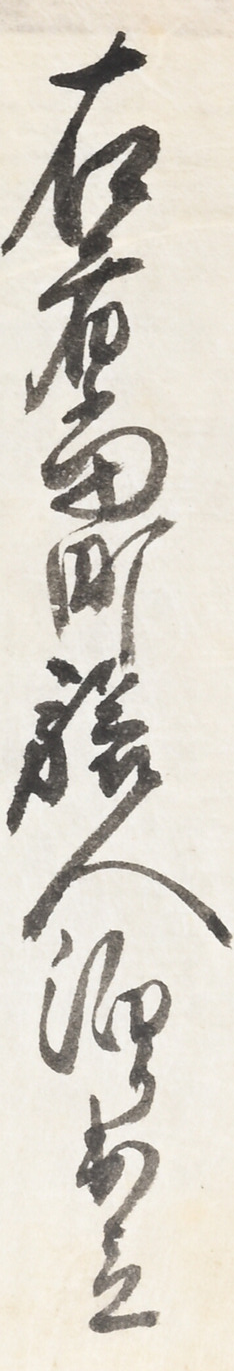右者当町旅人泊リ出立
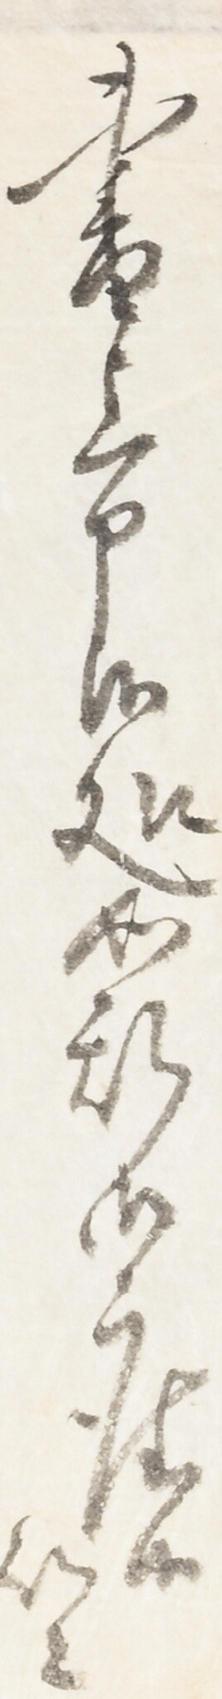書上申候処如斯御座候
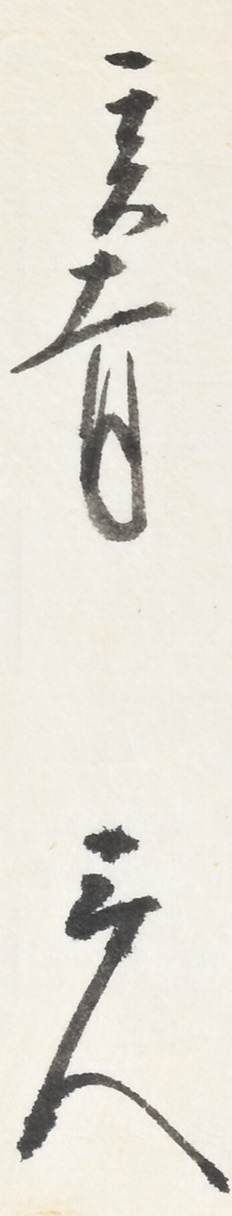亥十一月三人

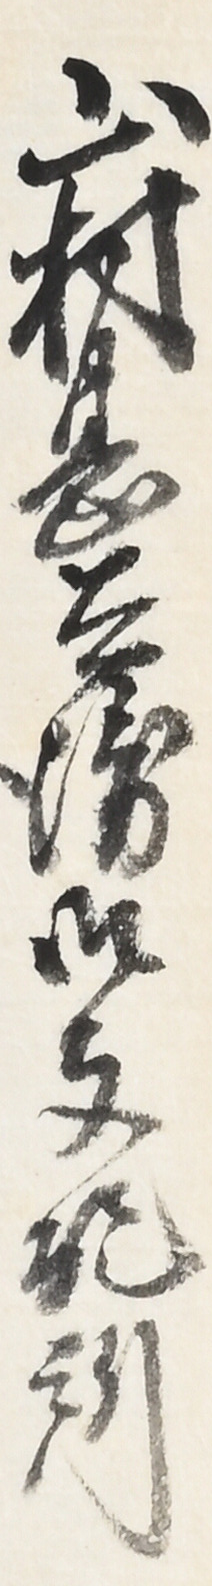山村甚兵衛御支配所
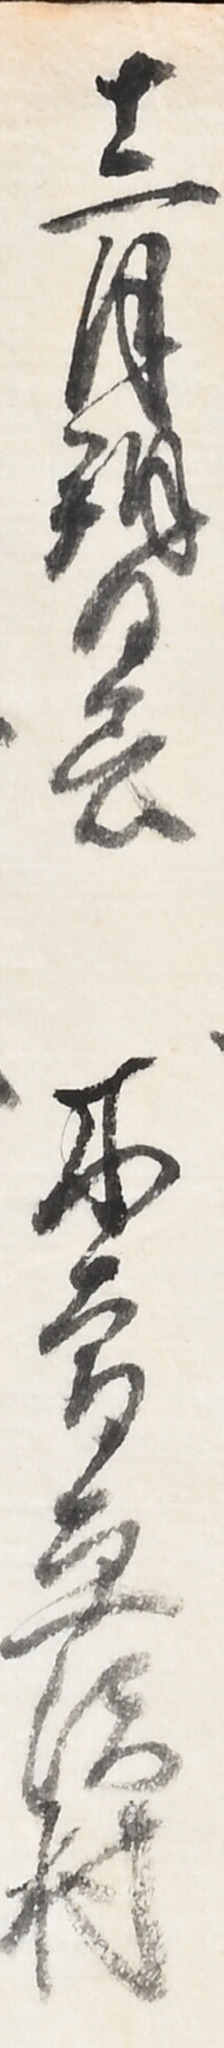十二月朔日着木曽平沢村
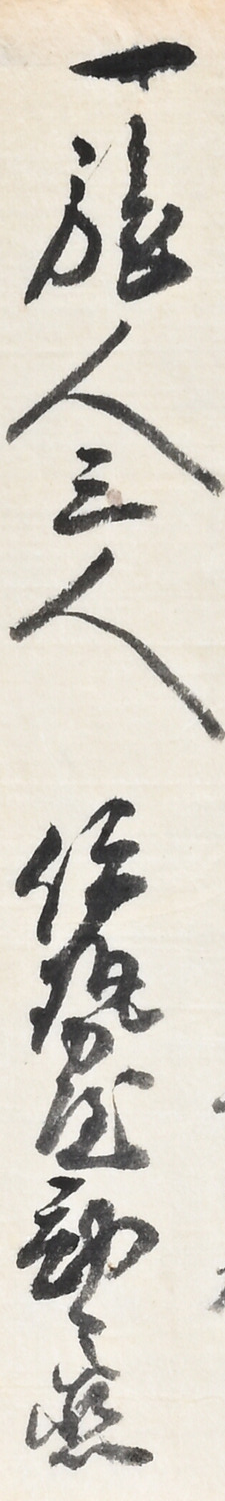一旅人三人伊勢屋勘之丞
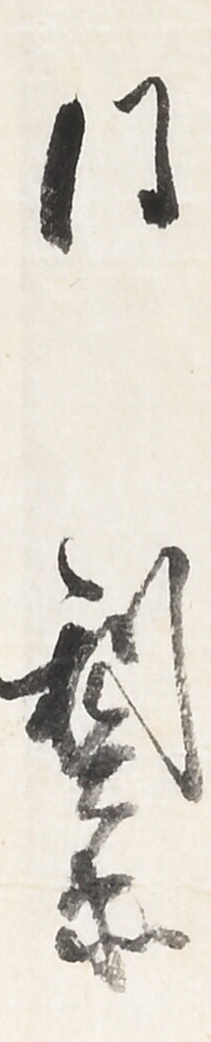同利兵衛
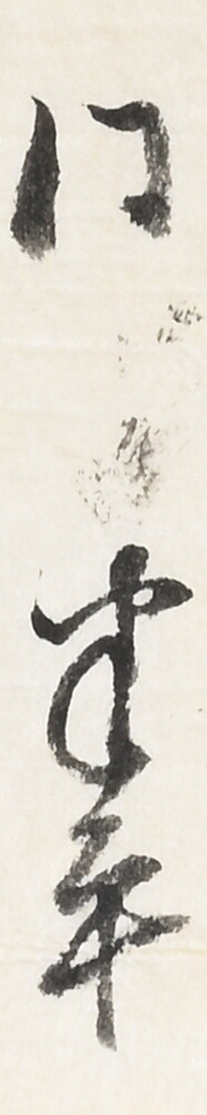同半平
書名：旅人泊控帳
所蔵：伊那市立高遠町図書館・合同会社AMANE
